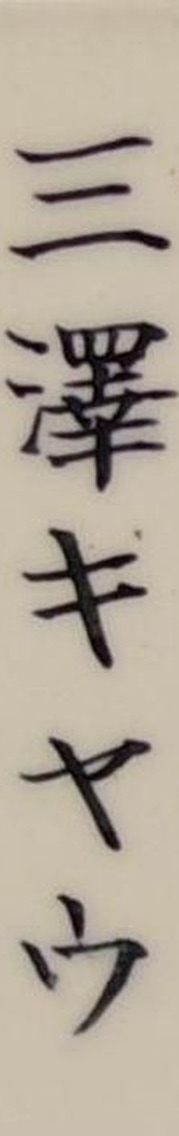三澤キヤウ
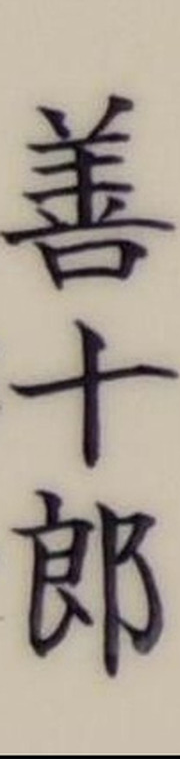善十郎
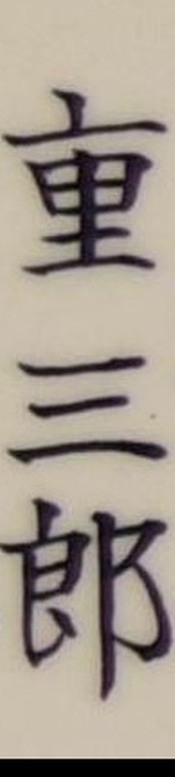重三郎
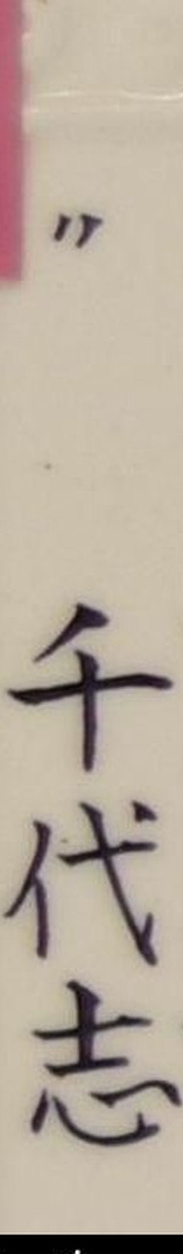千代志
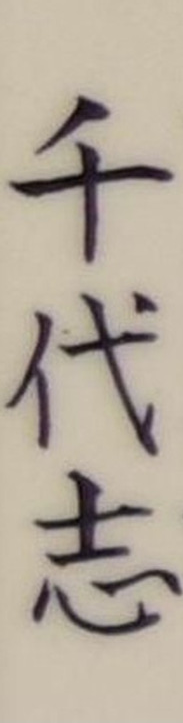千代志

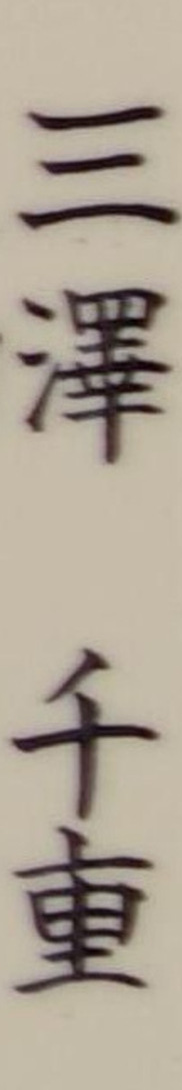三澤千重
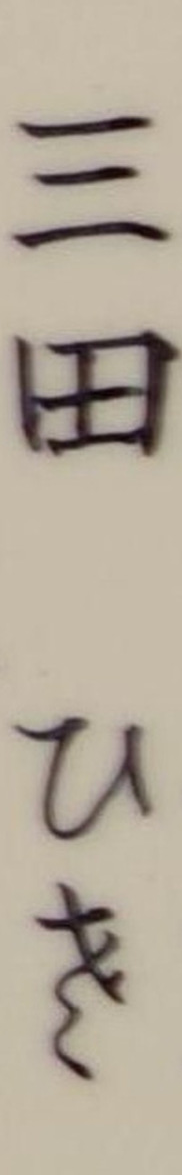三田ひさ
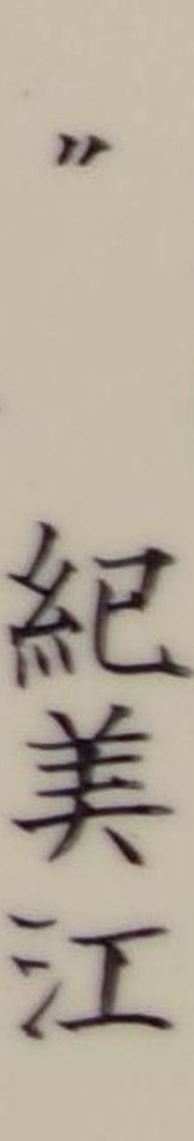紀美江
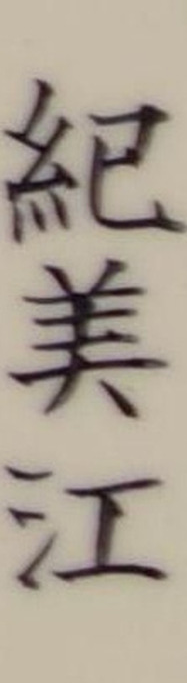紀美江
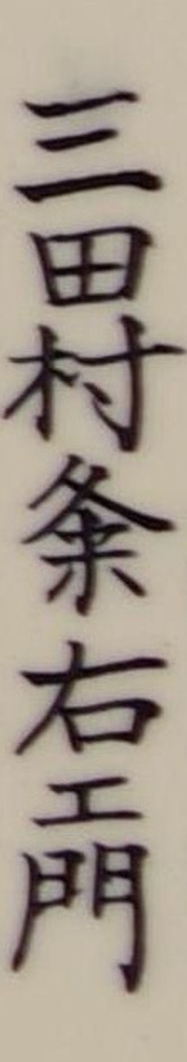三田村粂右エ門
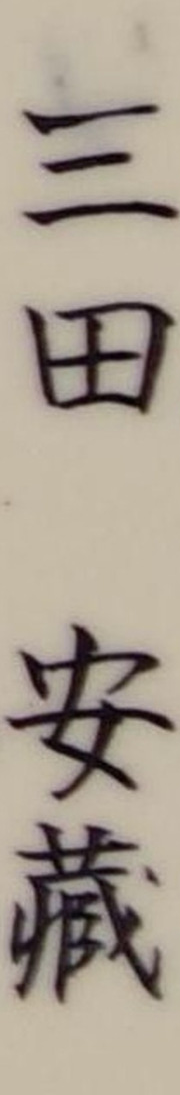三田安蔵
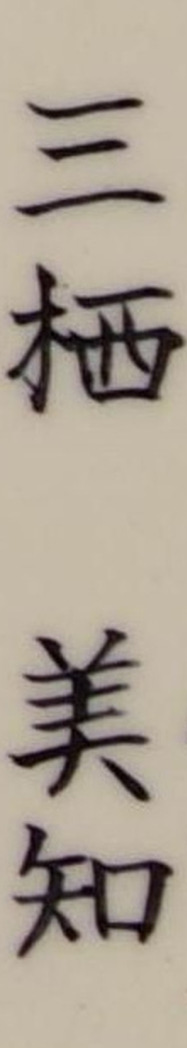三栖美知
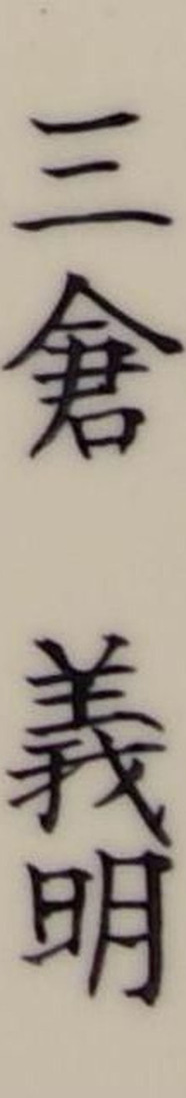三倉義明
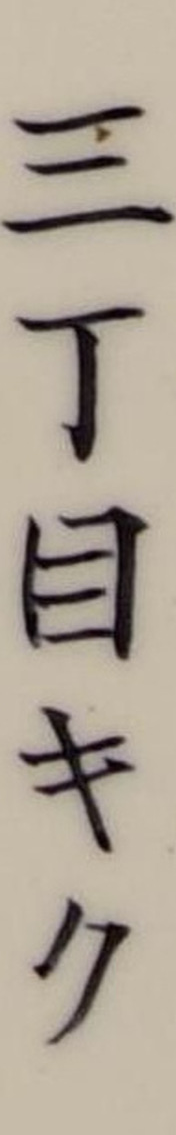三丁目キク
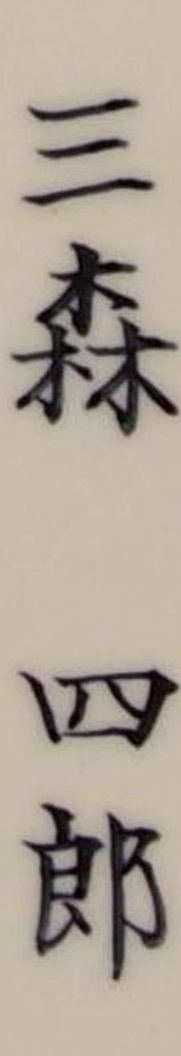三森四郎
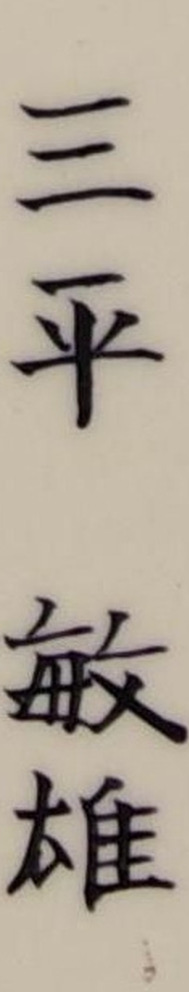三平敏雄
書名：E~L
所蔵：高野山金剛峯寺
